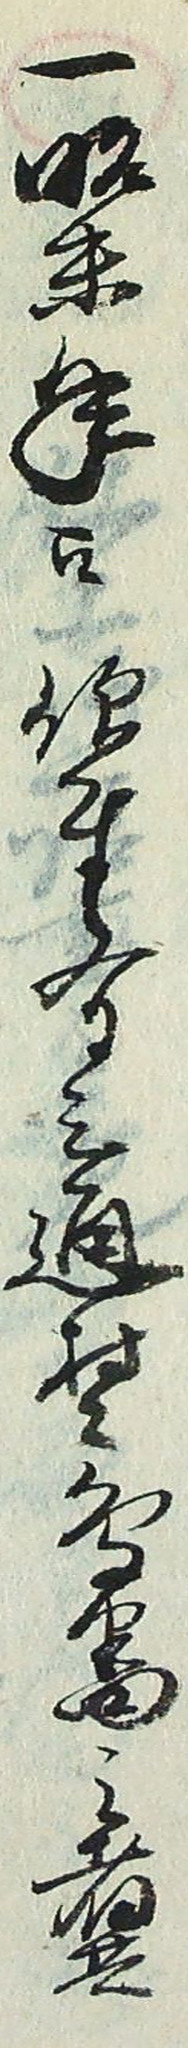一昨未年被仰付有之通村々鳥番之者共
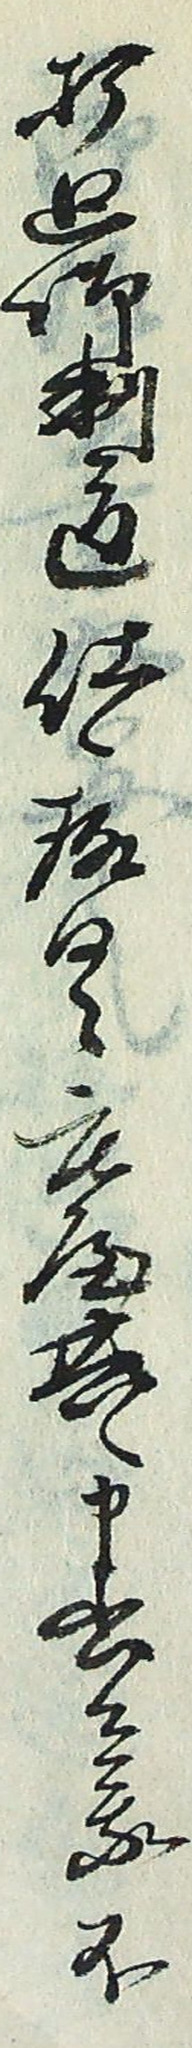打廻御制道仕候趣日々庄屋共へ申出候義不
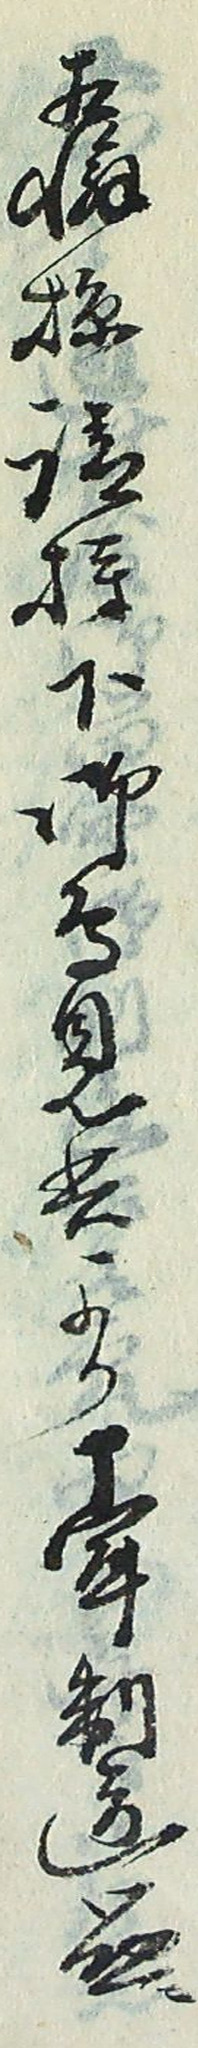相懈様請持下御鳥見共より申聞制道筋ニ
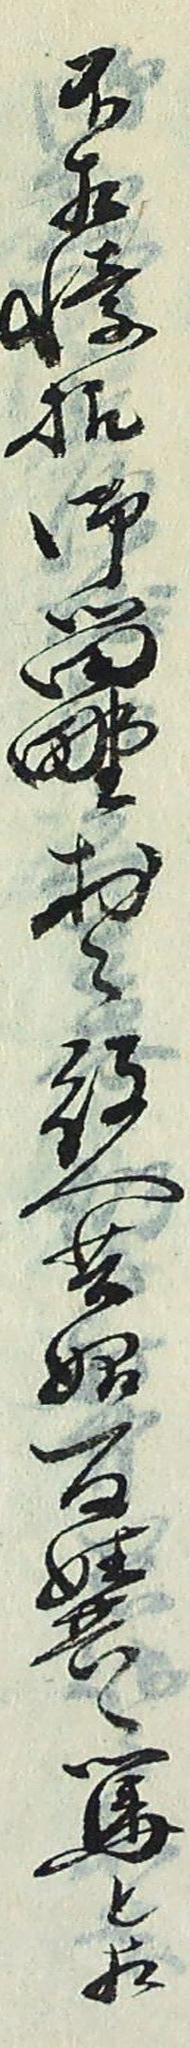不相悖様御留野村々役人共始百姓共へ篤と相
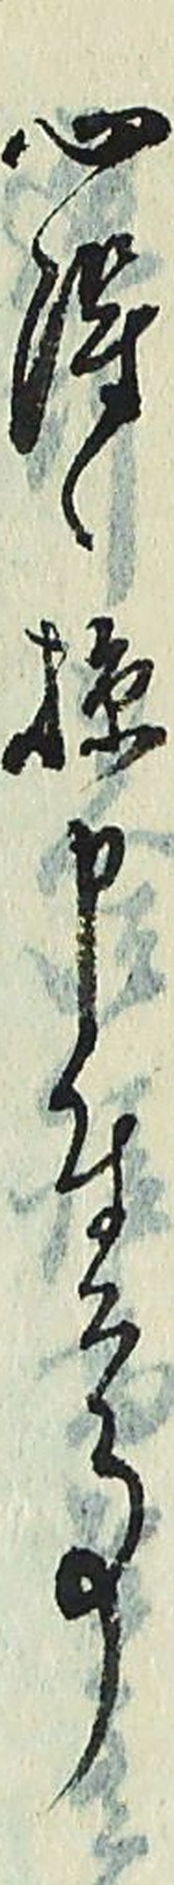心得候様申付候事
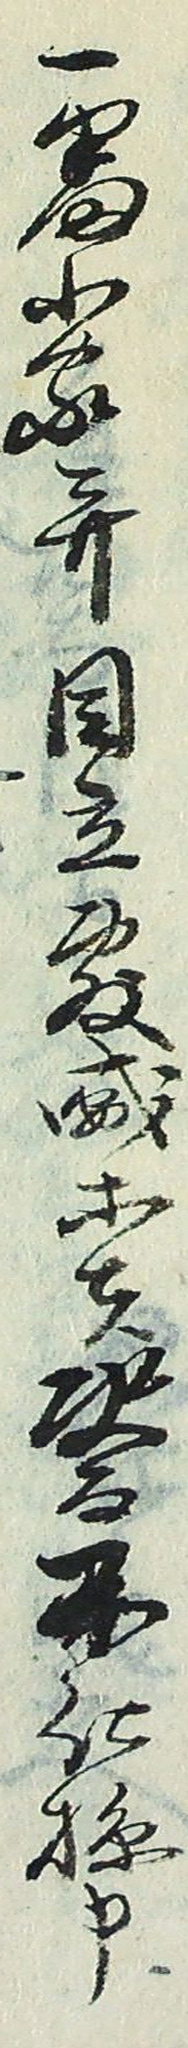一番小家幷目立敷威等者決而不仕様申
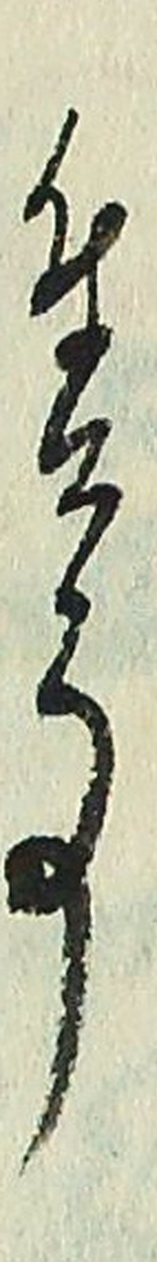付候事
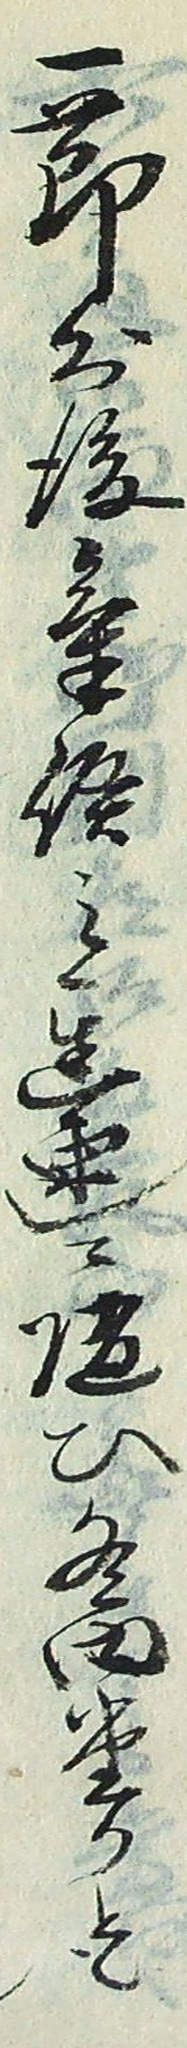一節分後気候之遅速ニ随ひ冬内たりとも
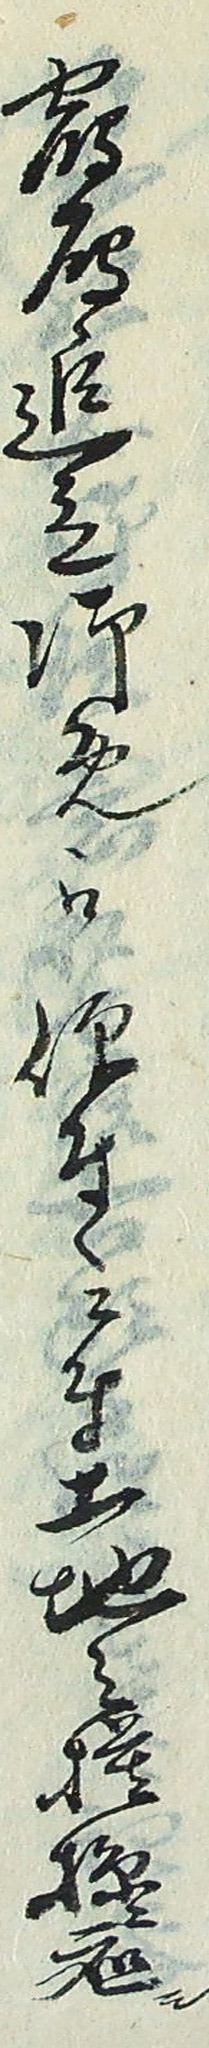鶴鴈追立御免被仰付候ニ付土地之模様ニ應シ
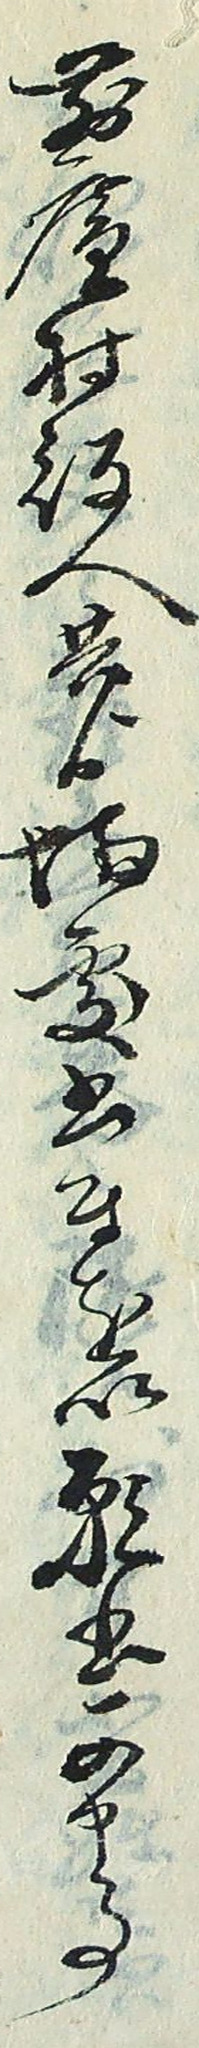前廣村役人共ゟ場處書付を以願出可申事
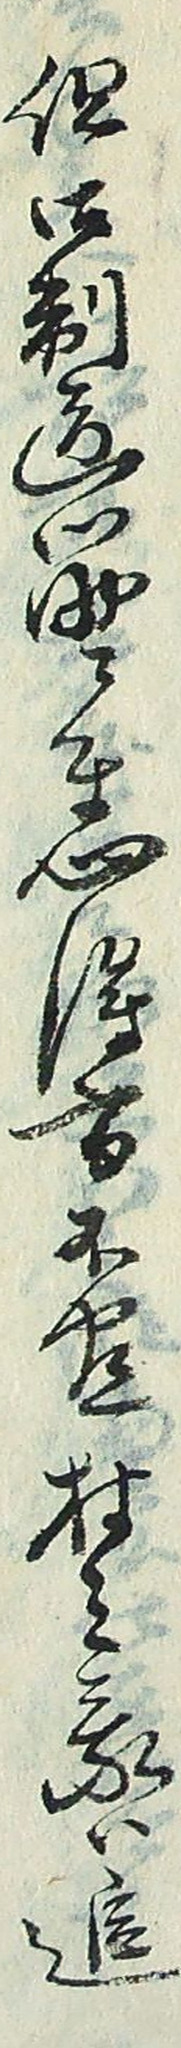但御制道筋ニ付心得方不盡村之義ハ追
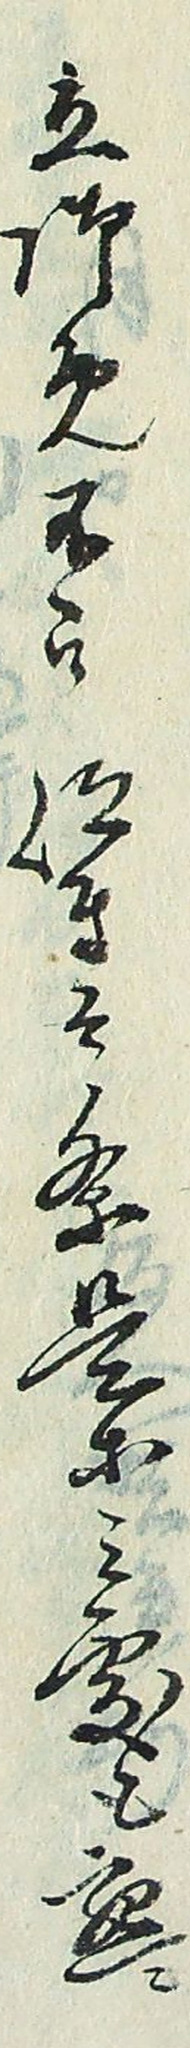立御免不被仰付候条是等之處も懇ニ

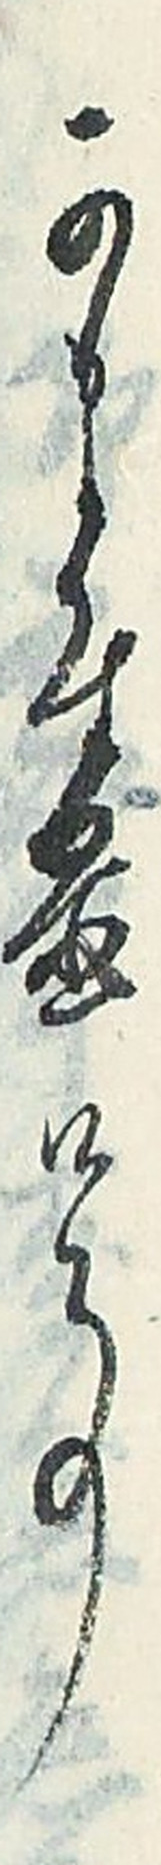可申付置候事
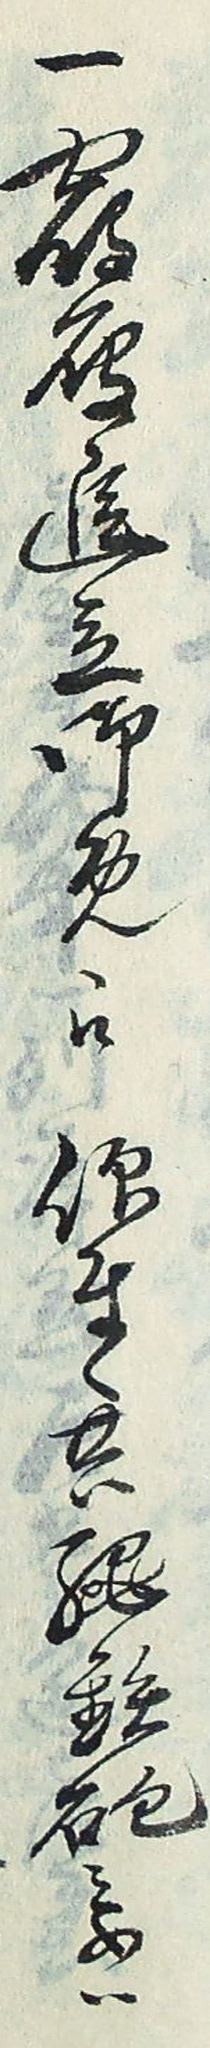一鶴鴈追立御免被仰付候共縄鉄砲之義ハ
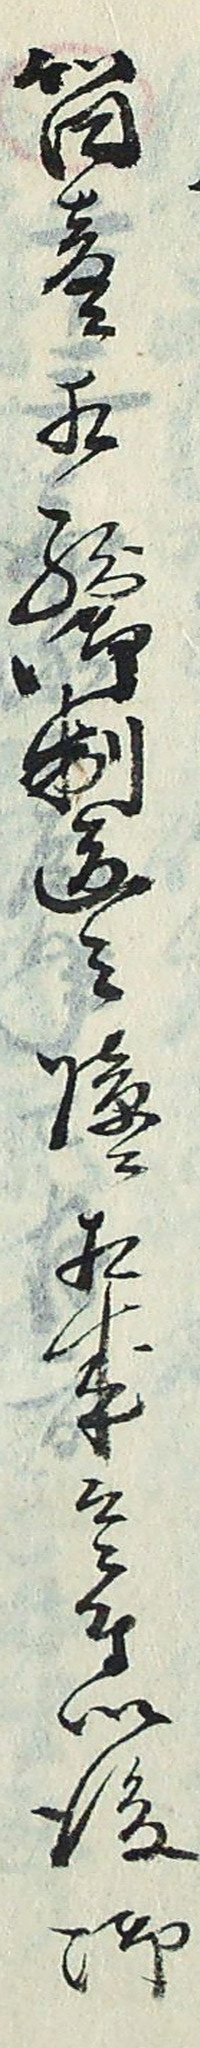筒音ニ相紛御制道之障ニ相成候ニ付以後御
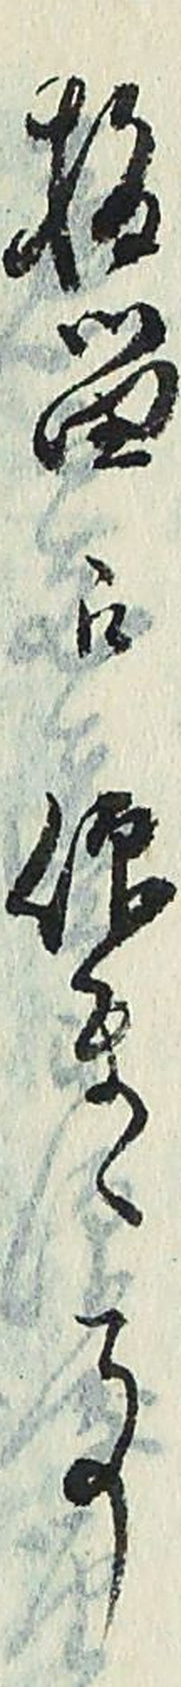指留被仰付候事
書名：諸御趣意書并御下知向之写
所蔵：鳴門教育大学 Naruto University of Education
